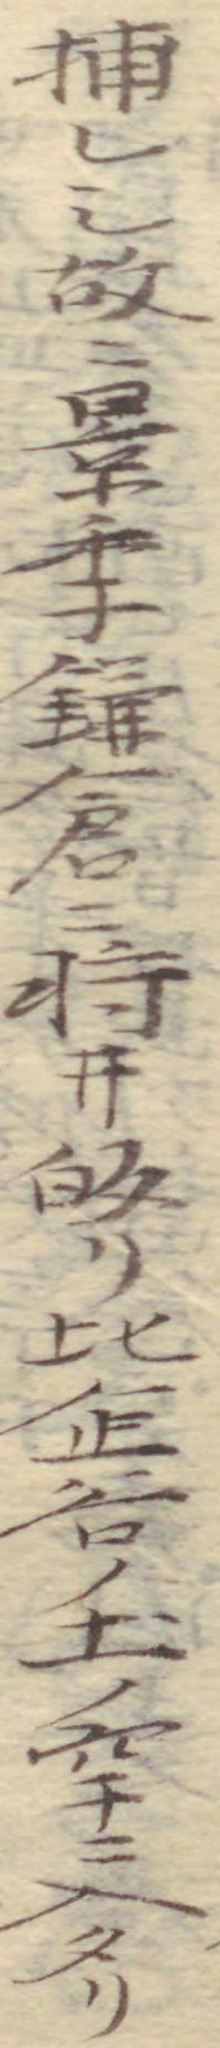捕レシ故ニ景季鎌倉ニ将ヰ帰リ比企谷ノ土ノ罕ニ入タリ
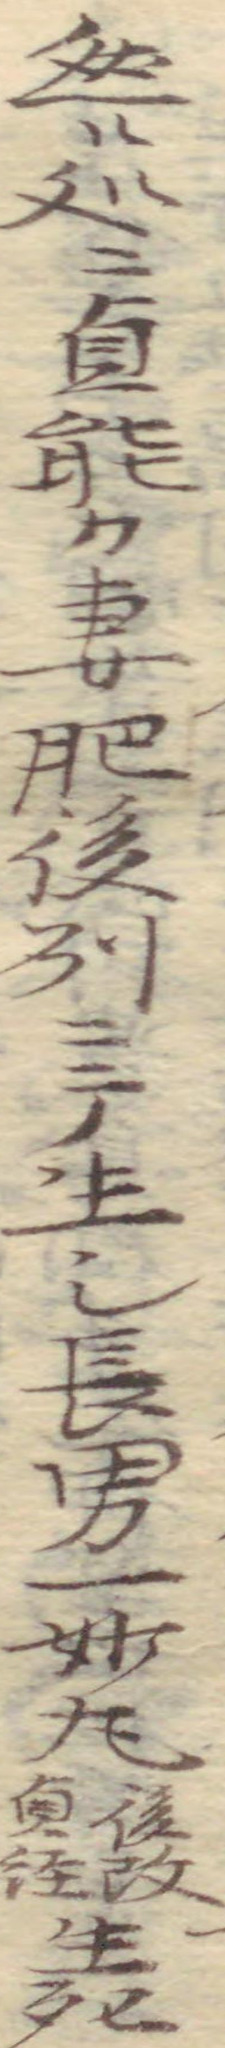然ル処ニ貞能カ妻肥後州ニテ生シ長男一妙丸後改貞経
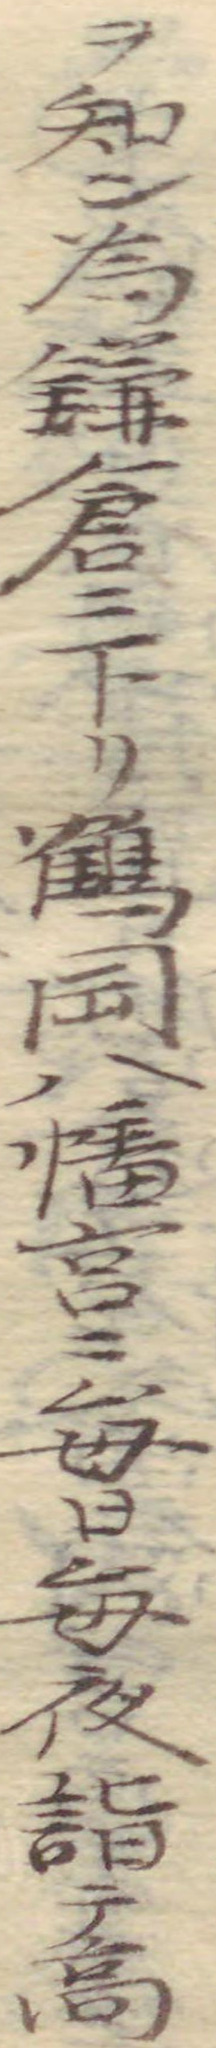ヲ知ン為鎌倉ニ下リ鶴岡八幡宮ニ毎日毎夜詣テ高
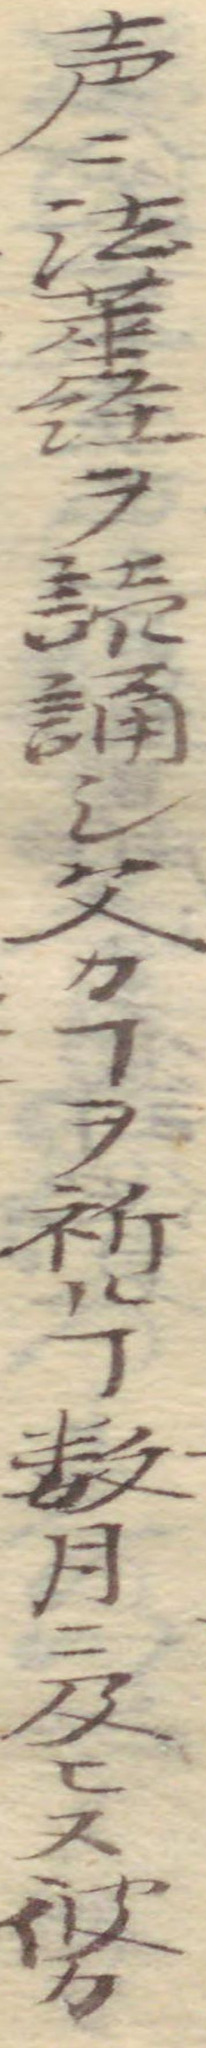声ニ法華経ヲ読誦シ父カコトヲ祈ルコト数月ニ及ヒヌ彼カ
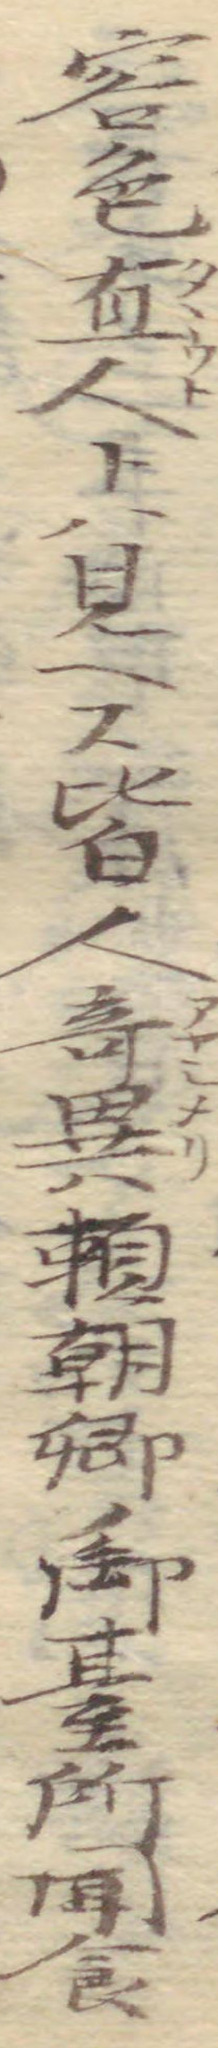容色直人トハ見ヘス皆人奇異頼朝卿ノ御台所聞食
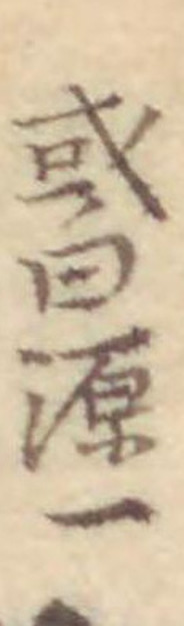或曰源一
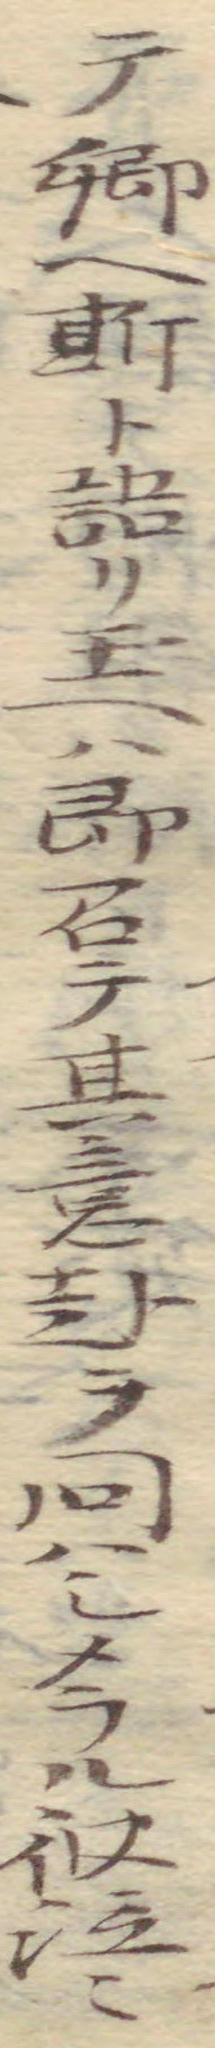テ卿ヘ斯ト語リ玉ヘハ即召テ其意赴ヲ問ハシメラル彼泣々
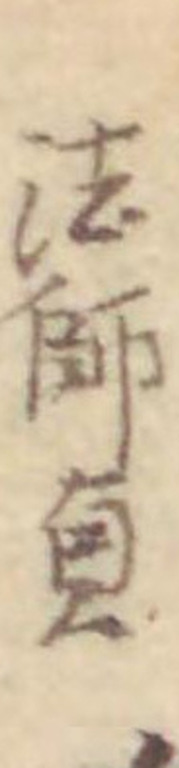法師貞
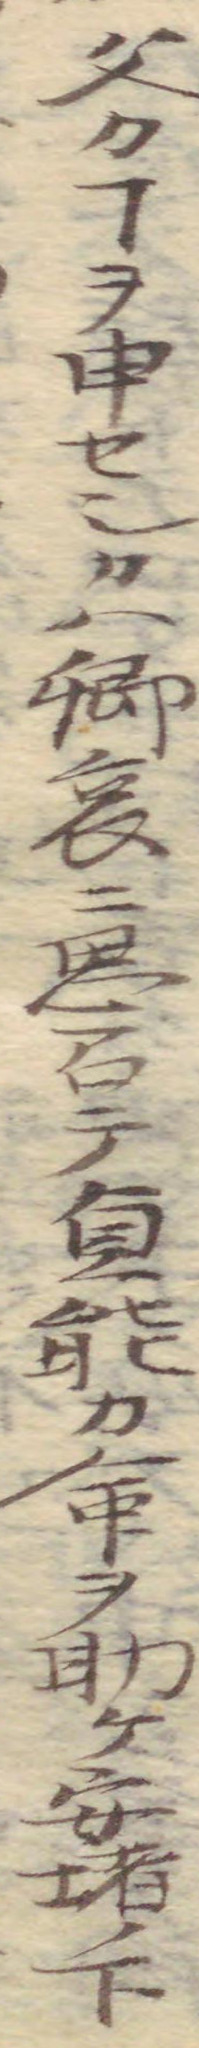父カコトヲ申セシカハ卿哀ニ思召テ貞能カ命ヲ助ケ安堵ノ下
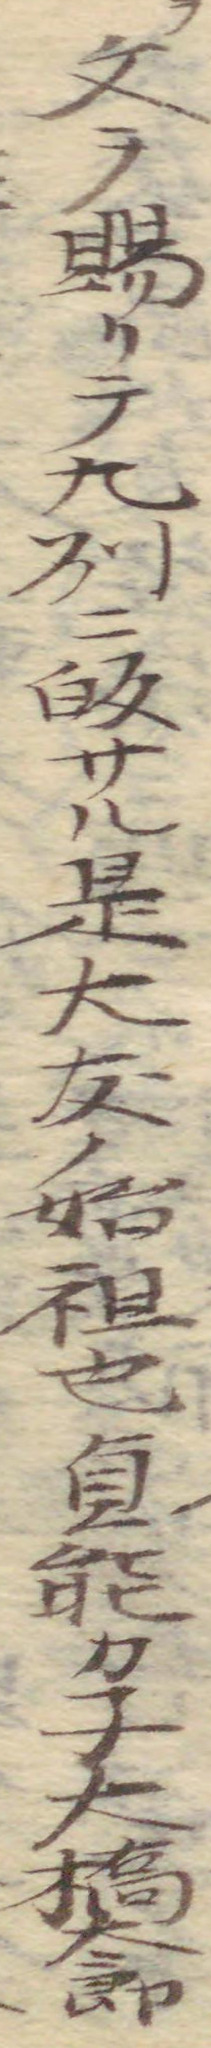文ヲ賜リテ九州ニ帰サル是大友ノ始祖也貞能カ子大橋太郎

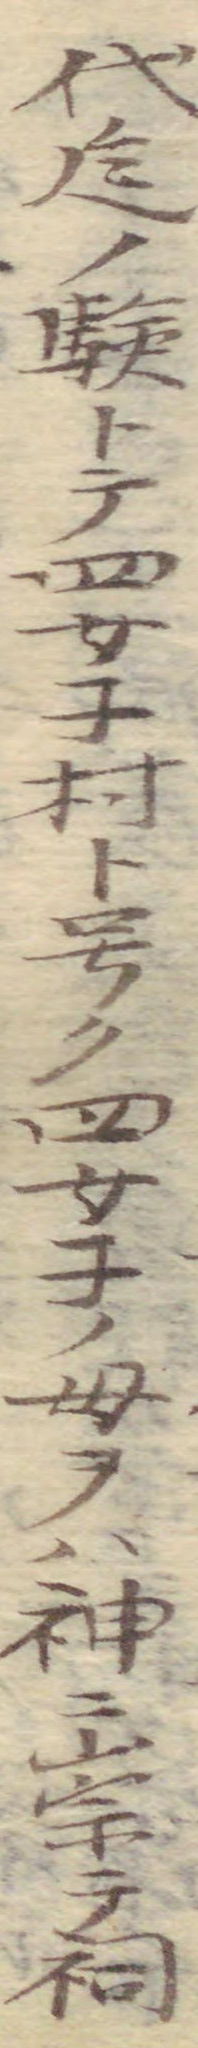代迄ノ験トテ四女子村ト号ク四女子ノ母ヲハ神ニ崇テ祠
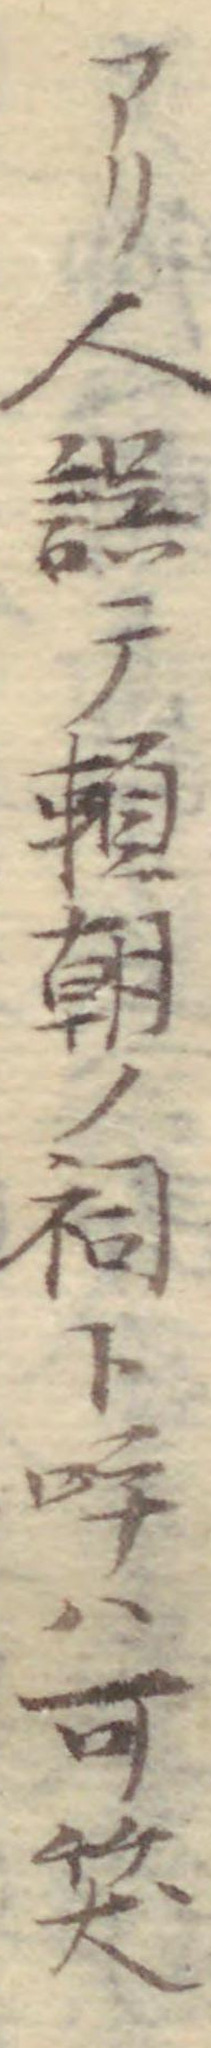アリ人誤テ頼朝ノ祠ト呼ハ可笑
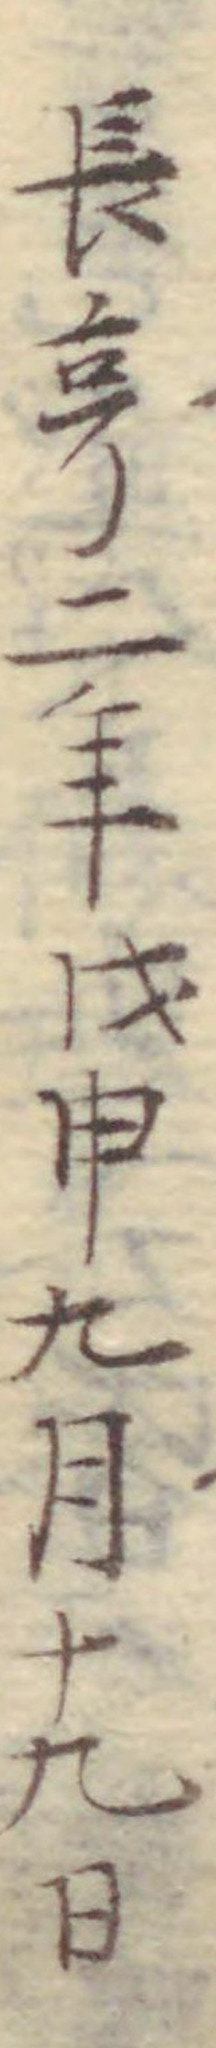長亨二年戊申九月十九日
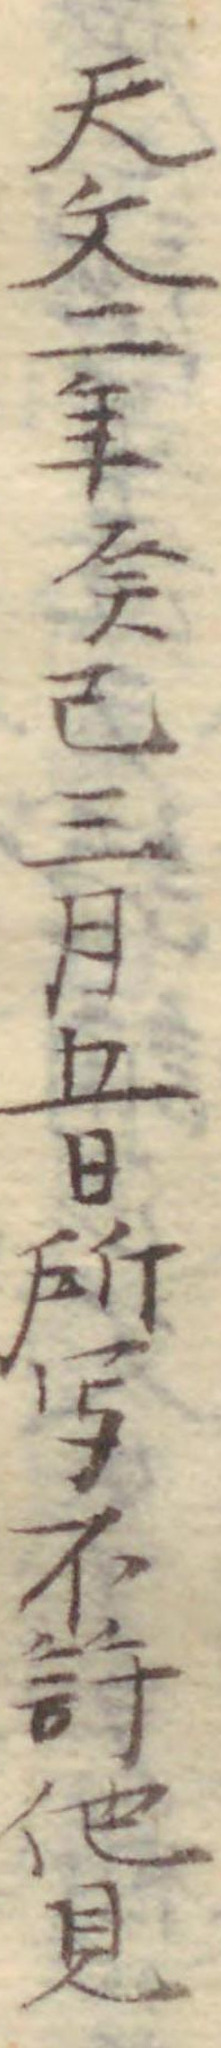天文二年癸巳三月五日所写不許他見
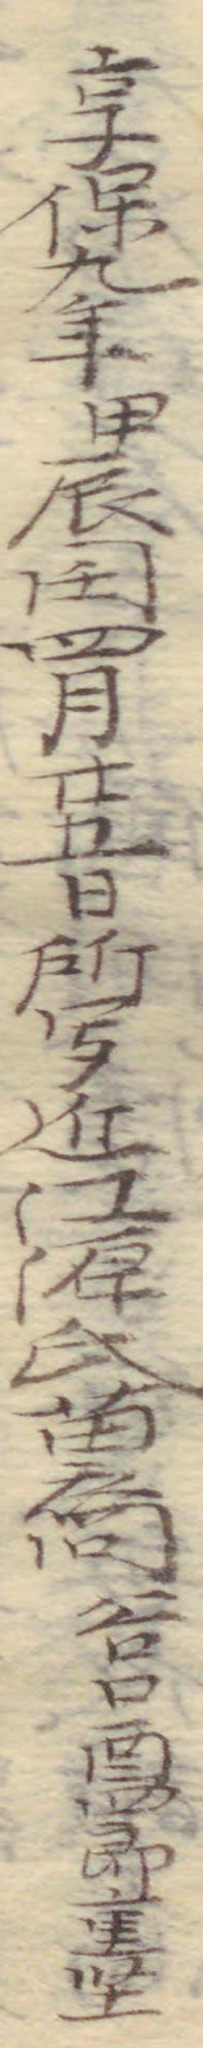享保九年甲辰閏四月廿五日所写近江源氏苗裔谷口酉四郎重堅
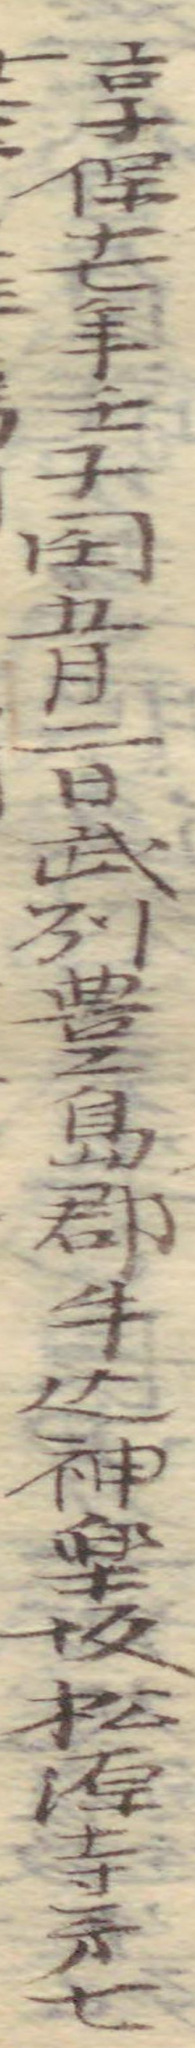享保十七年壬子閏五月二日武州豊島郡牛込神楽坂松源寺第七
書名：鶯宿雑記. 巻199-200
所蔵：国立国会図書館 National Diet Library, JAPAN
